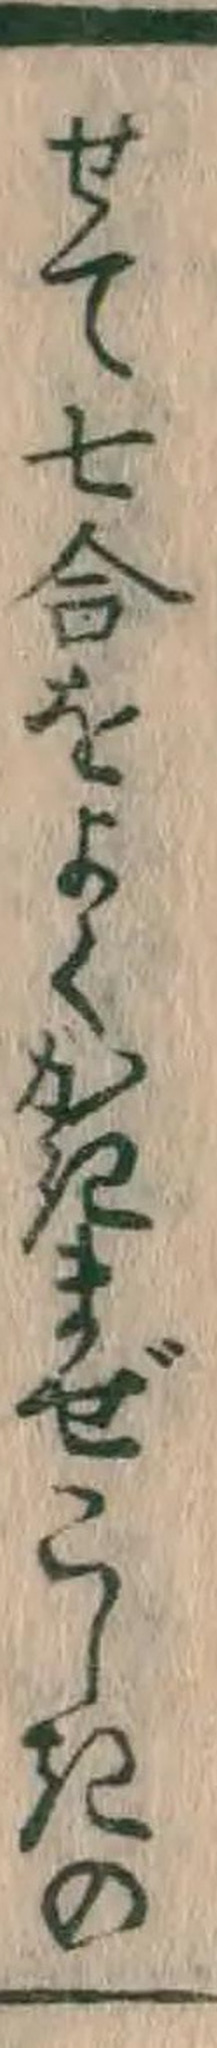せて七合をよくかきまぜこしきの
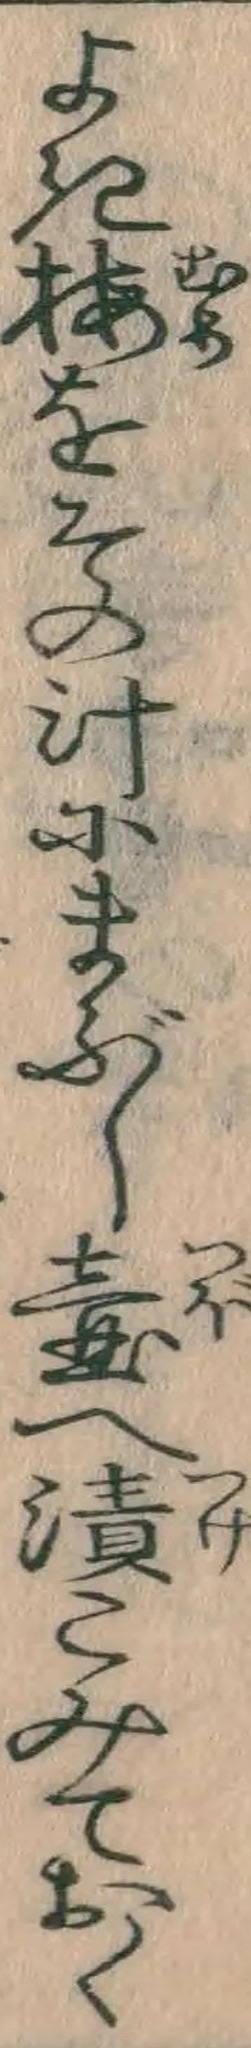よき梅をその汁にまぶし壺へ漬こみておく
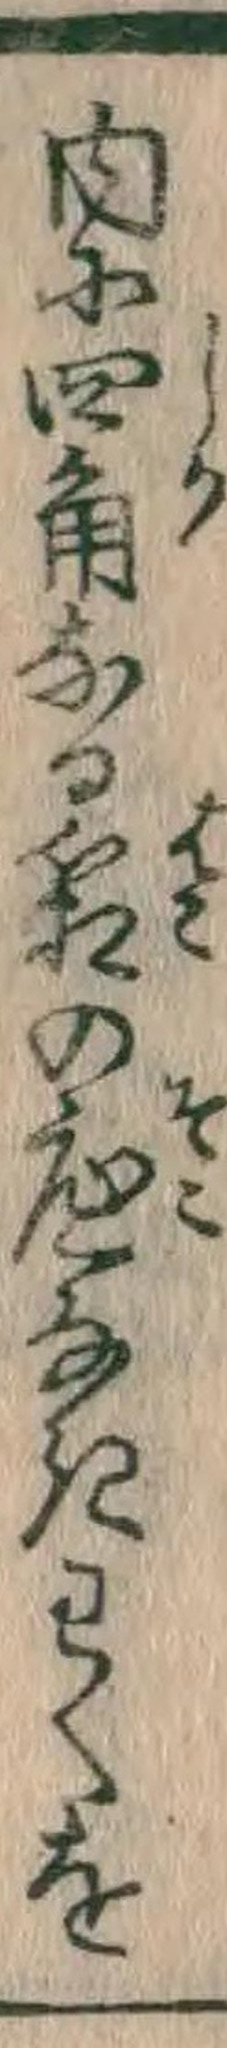内に四角なる箱の底なきわくを
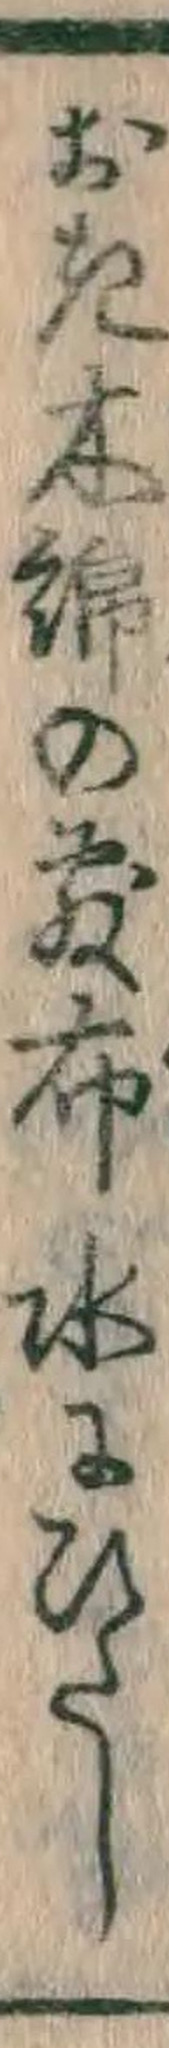おき木綿の敷布水にひたし
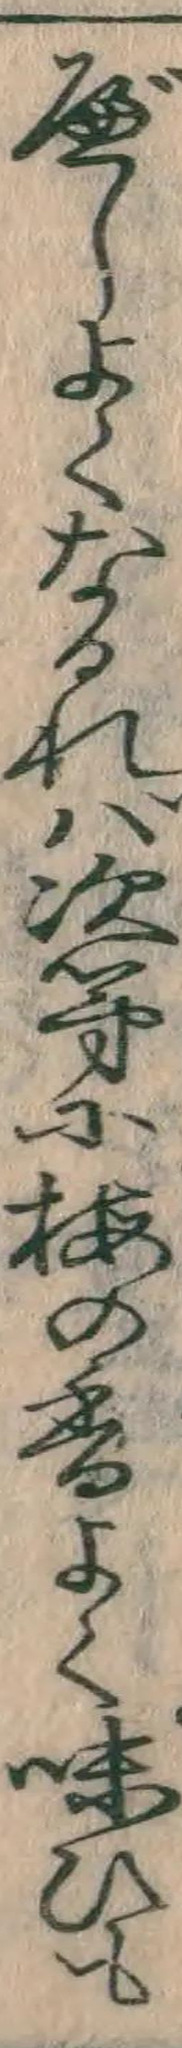べしよくなるれば次第に梅の香よく味ひも
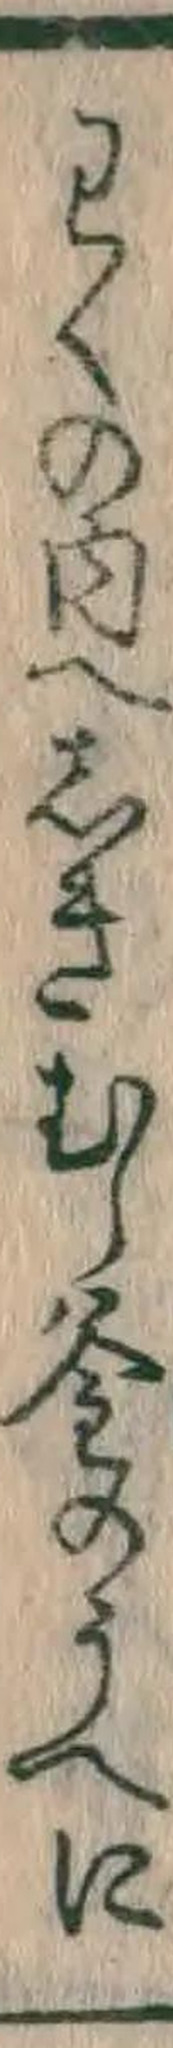わくの内へしきむし釜のうへに
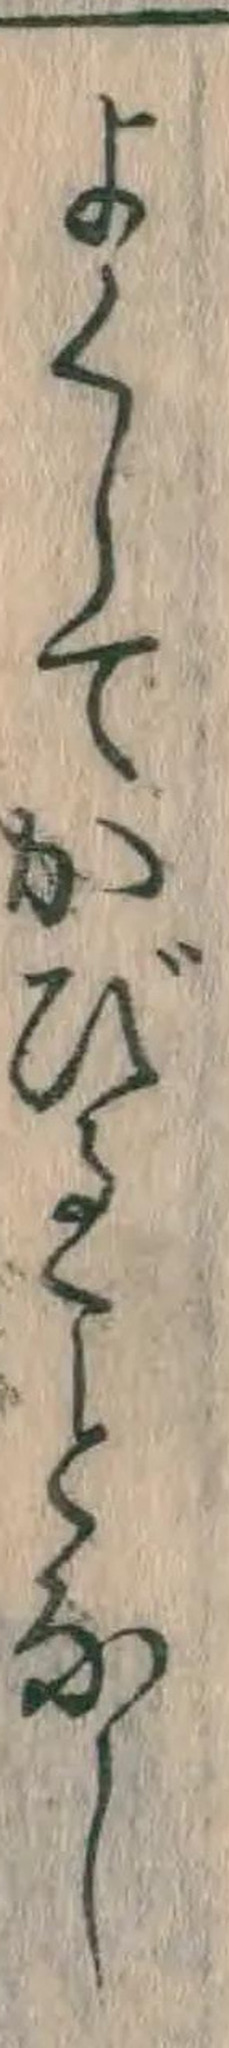よくしてかびることなし
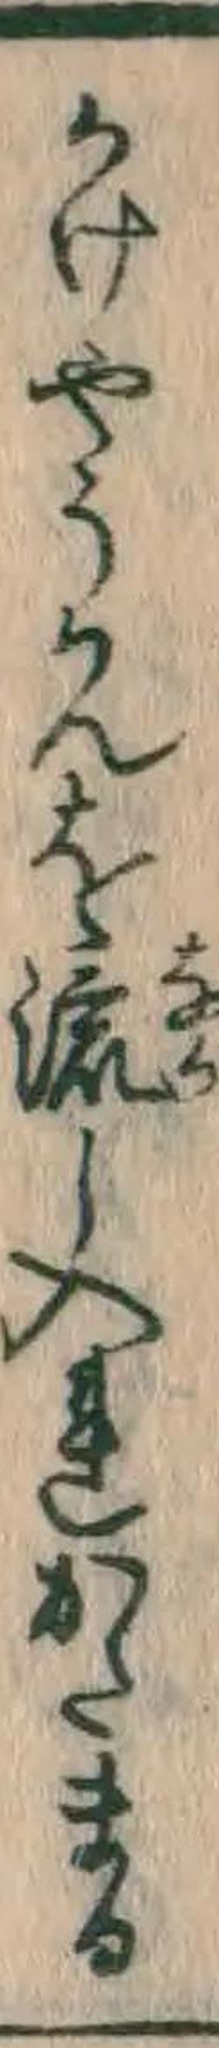かけやうかんを流し入れかたまる
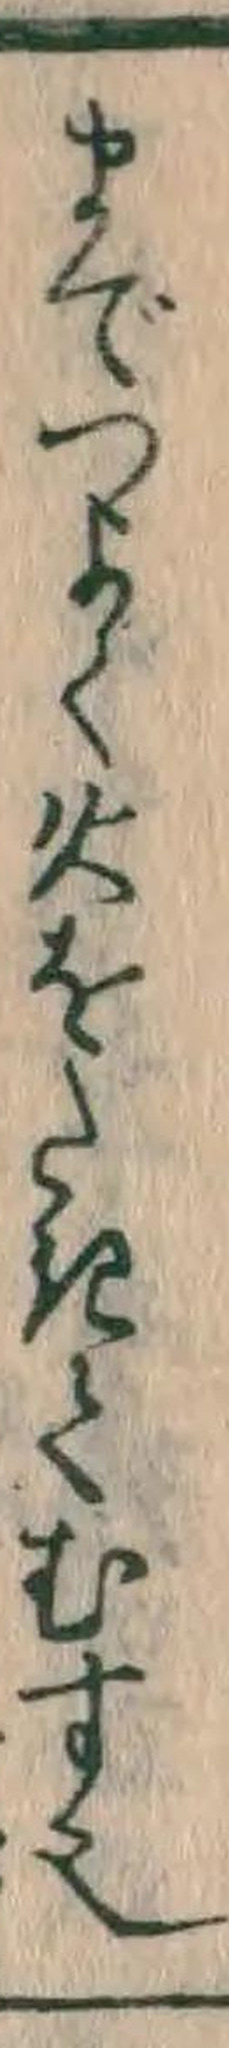までつよく火をたきてむす也
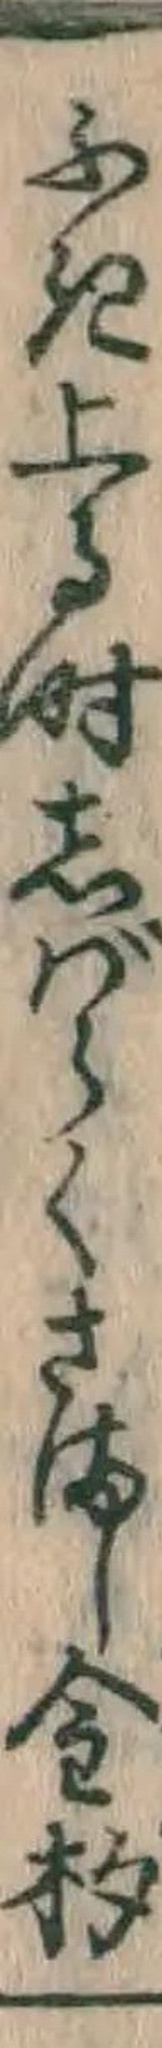ふき上る時しばらくさまし金杓
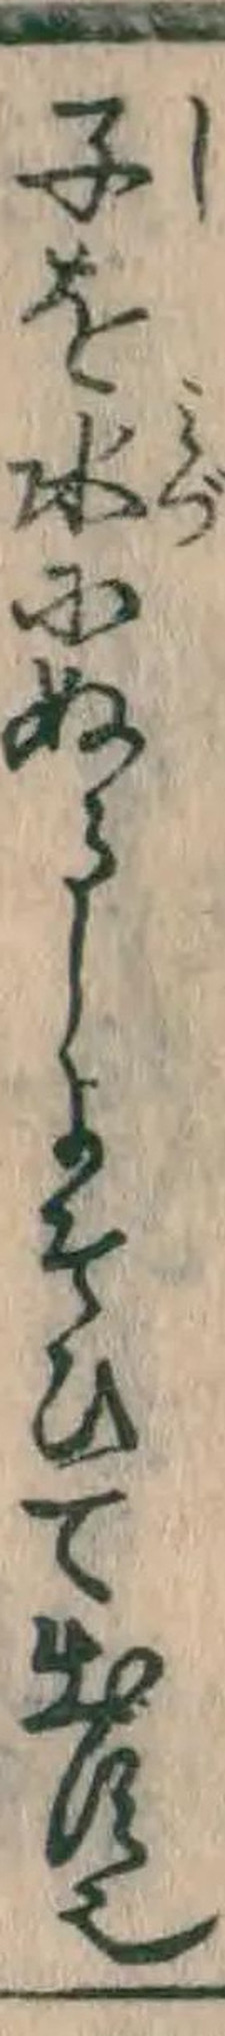子を水にぬらしよそひて出す也
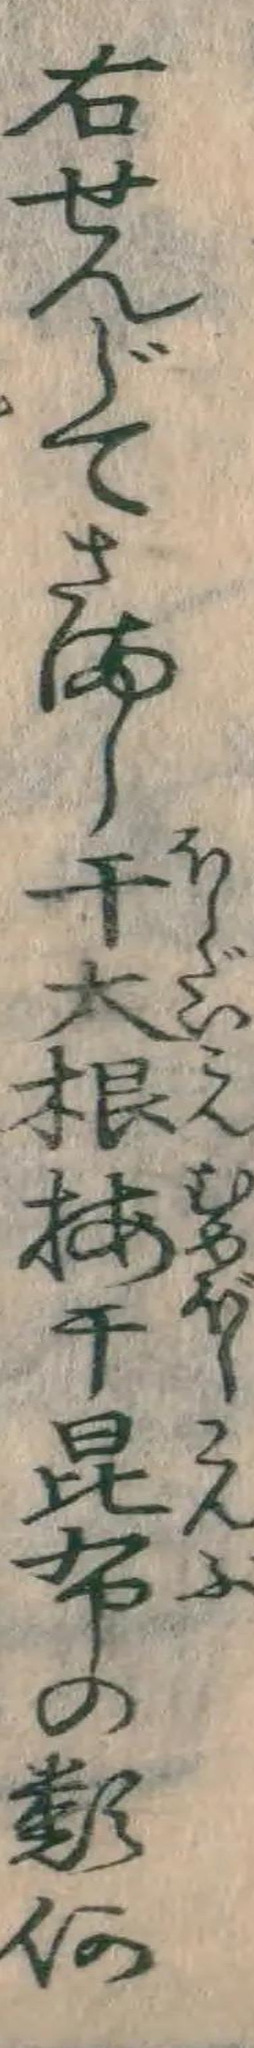右せんじてさまし干大根梅干昆布の類何
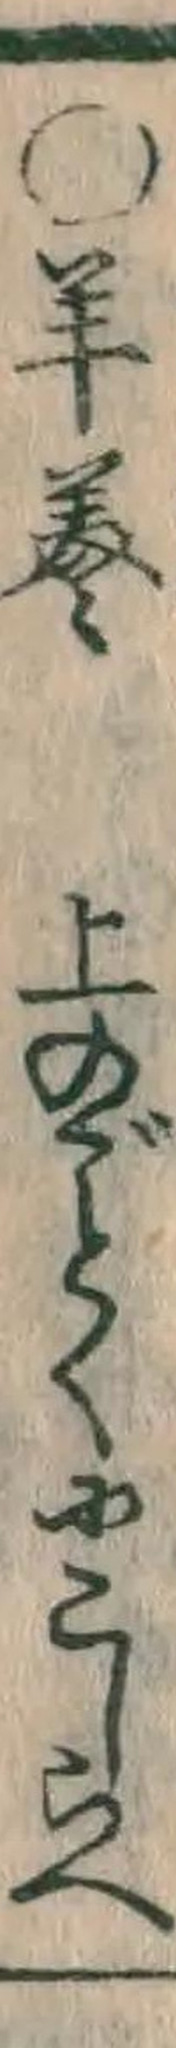○羊羹上のごとくにこしらへ
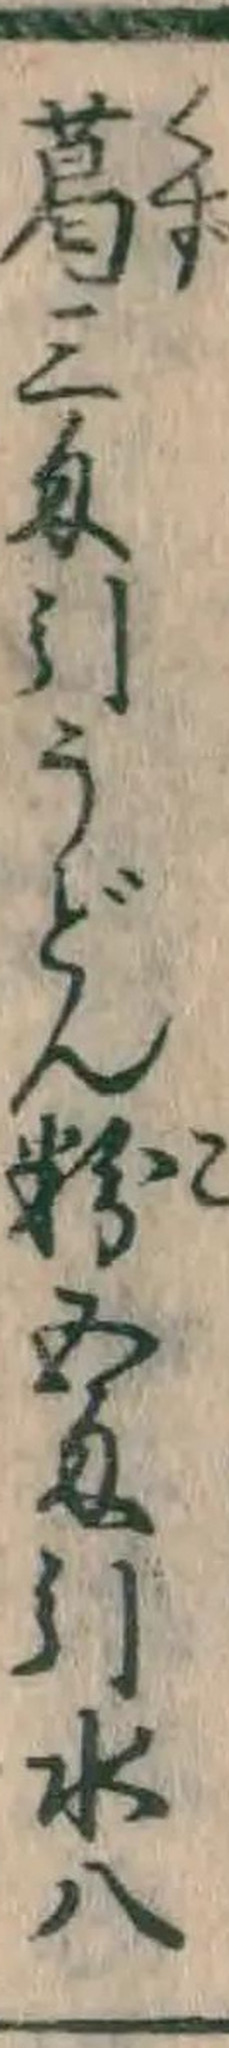葛三匁引うどん粉五匁引水八
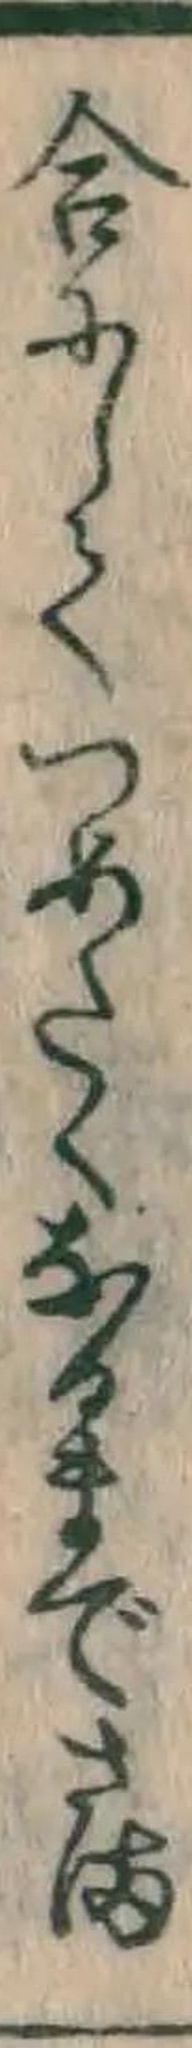合にしてつめたくなるまでさま
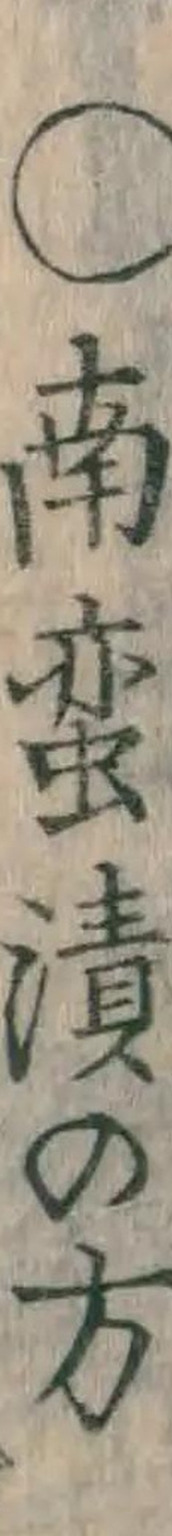○南蛮漬の方
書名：広益秘事大全 3巻. [5]
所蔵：国立国会図書館 National Diet Library, JAPAN
